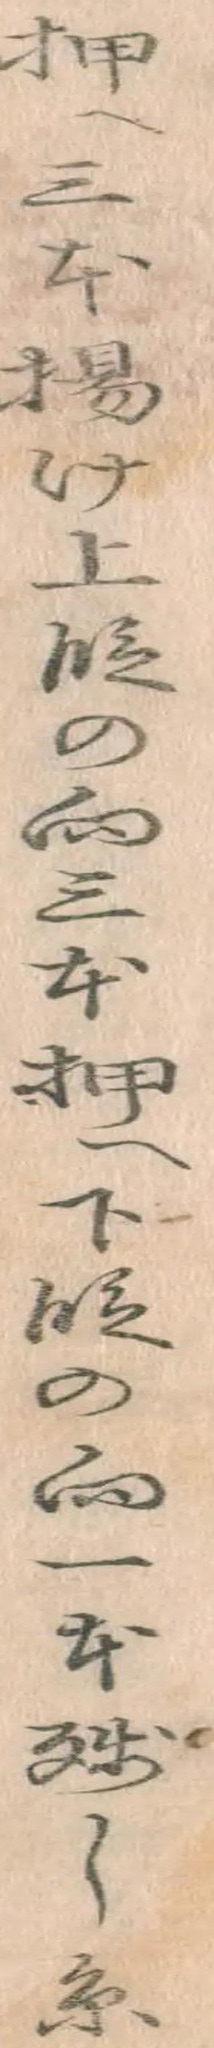押へ三本揚け上段の向三本押へ下段の向一本残し糸
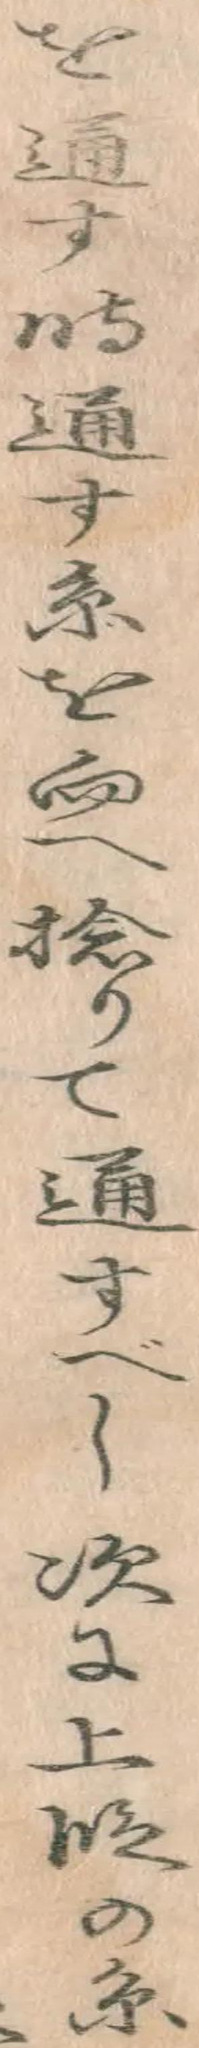を通す時通す糸を向へ捻りて通すべし次に上段の糸
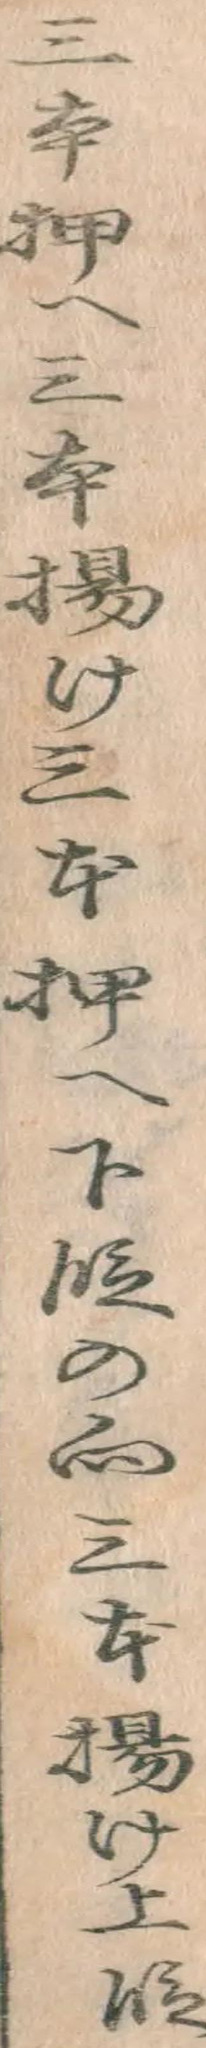三本押へ三本揚け三本押へ下段の向三本揚け上段

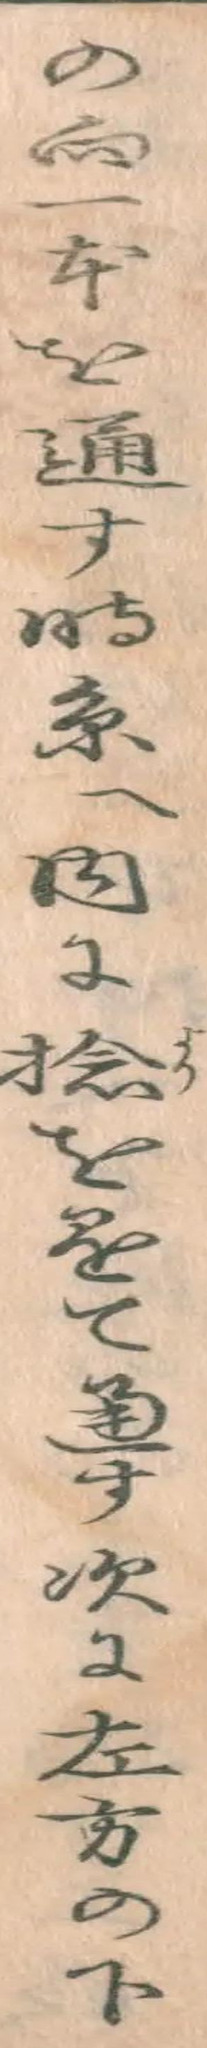の向一本を通す時糸へ内に捻を懸て通す次に左方の下
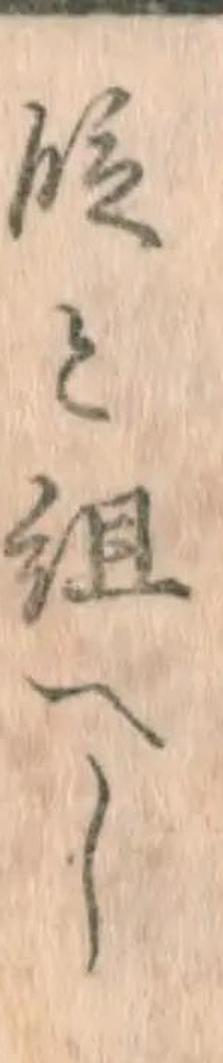段と組へし
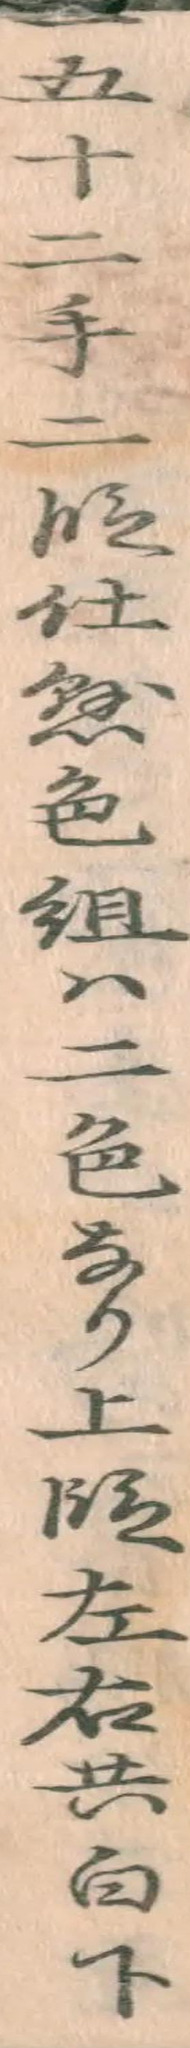一五十二手二段仕懸色組は二色なり上段左右共白下
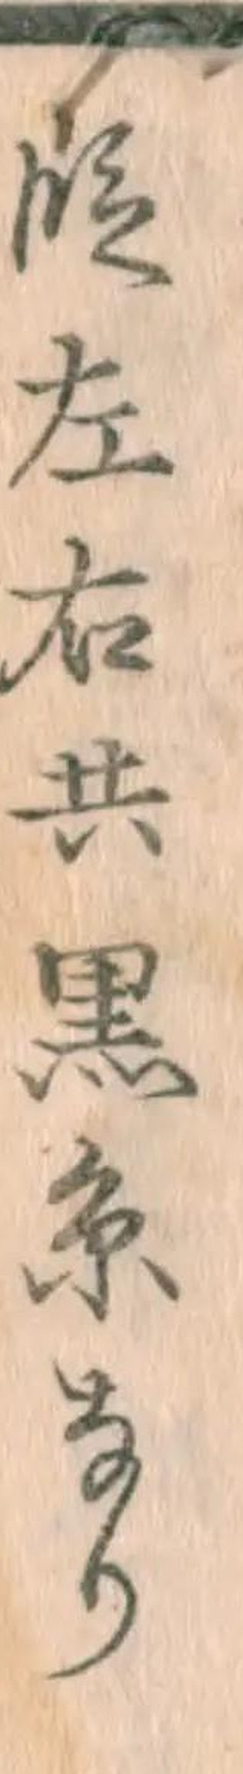段左右共黒糸なり
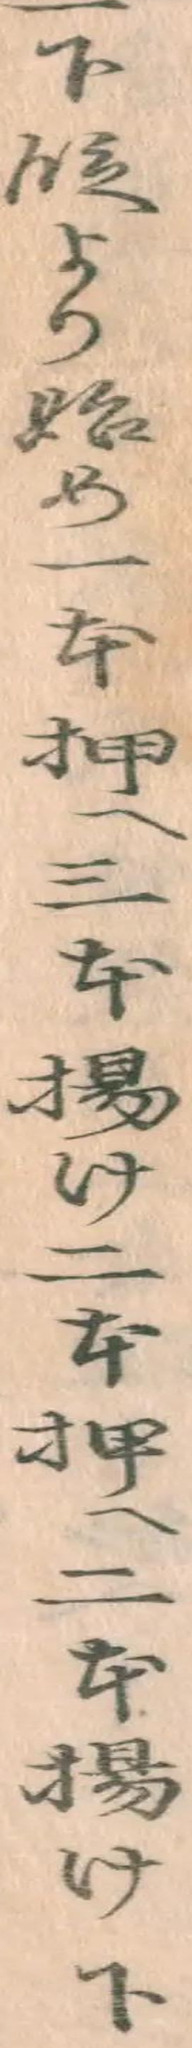一下段より始め一本押へ三本揚け二本押へ二本揚け下
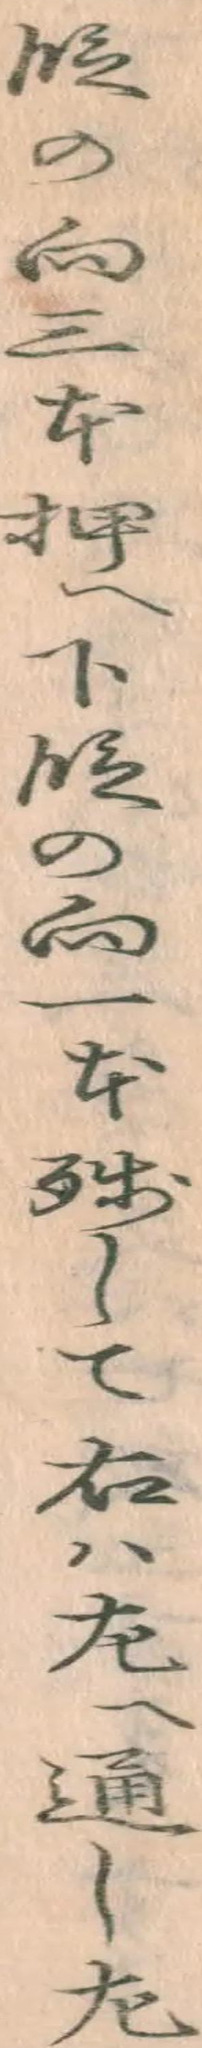段の向三本押へ下段の向一本残して右は左へ通し左
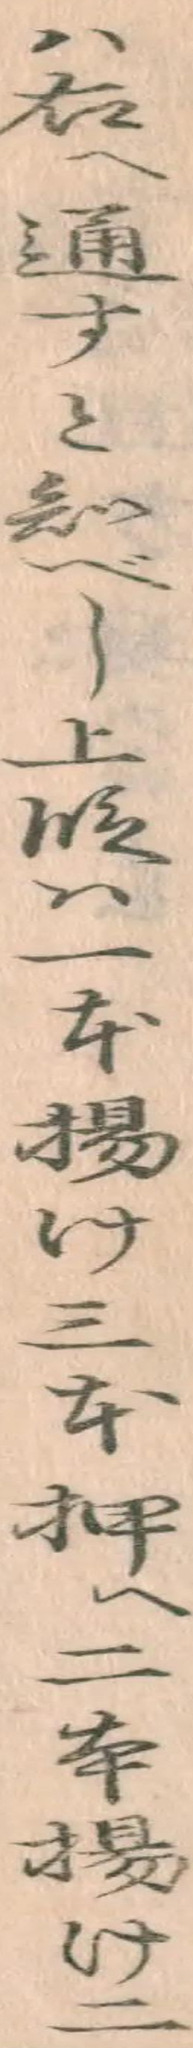は右へ通しと知べし上段は一本揚け三本押へ二本揚け二
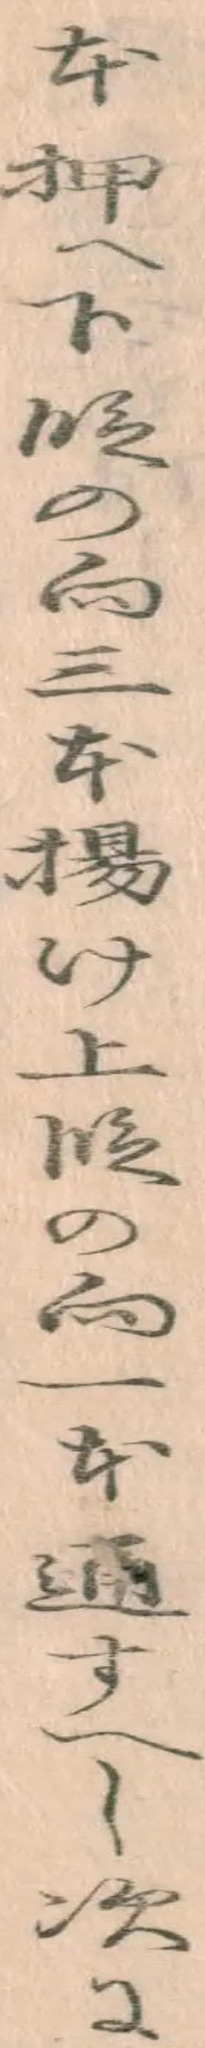本押へ下段の向三本揚け上段の向一本通すへし次に
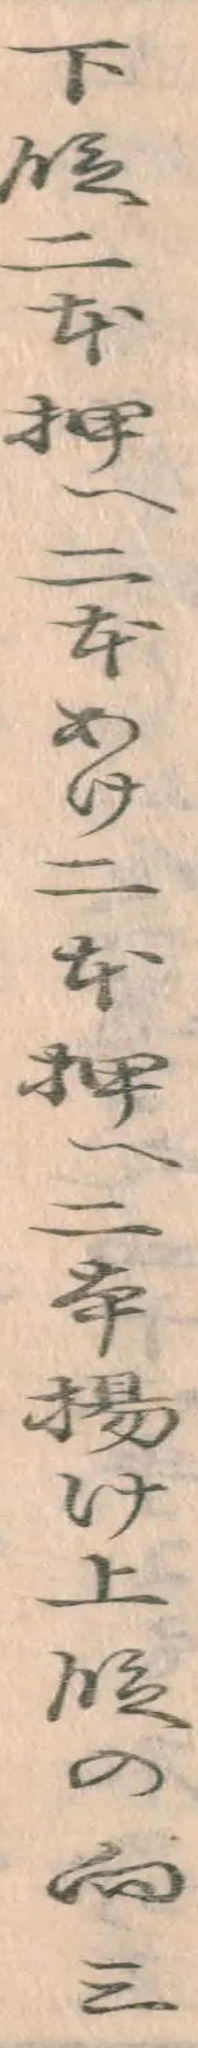下段二本押へ二本あけ二本押へ二本揚け上段の向三
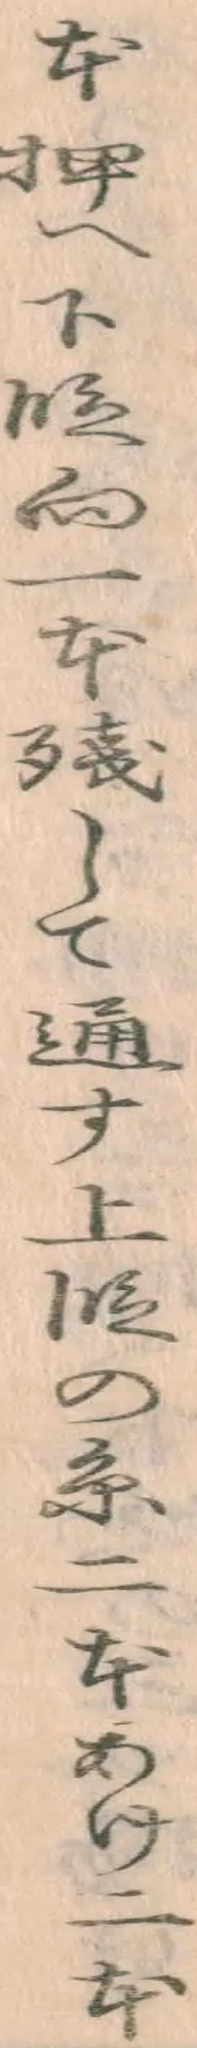本押へ下段向一本残して通す上段の糸二本あけ二本
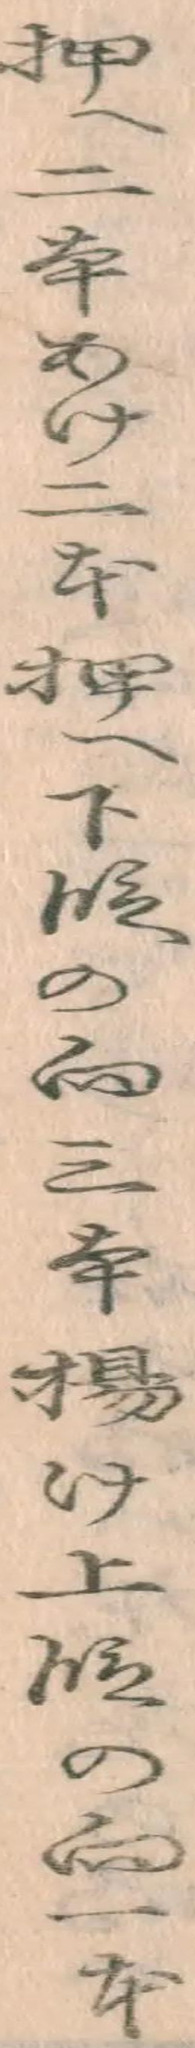押へ二本あけ二本押へ下段の向三本揚け上段の向一本
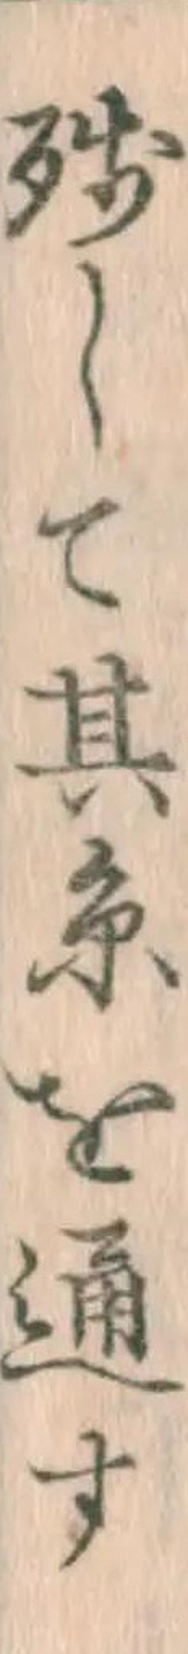残して其糸を通す
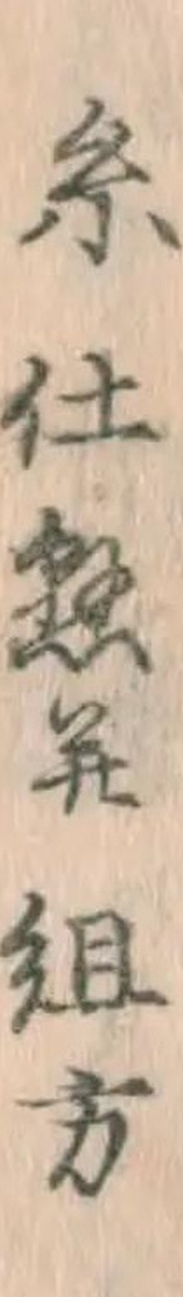糸仕懸幷組方
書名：機織彙編 5巻. [2]
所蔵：国立国会図書館 National Diet Library, JAPAN
